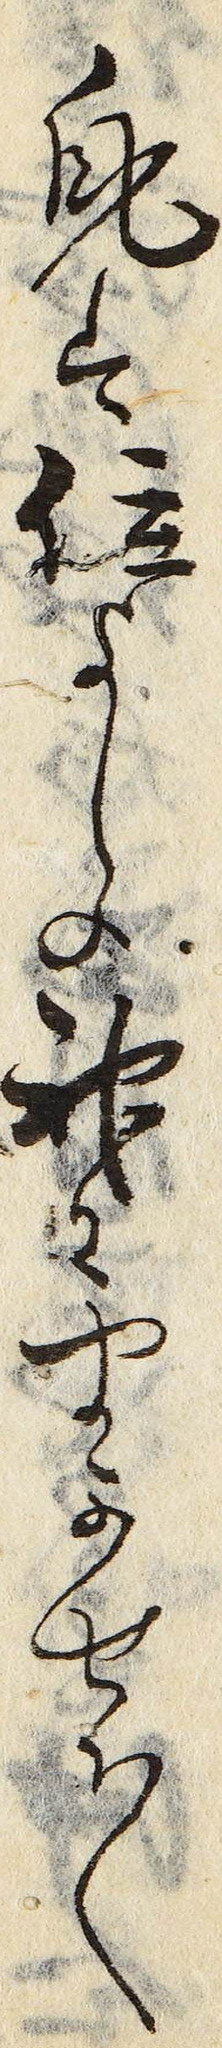身は住よしの神にまかせて
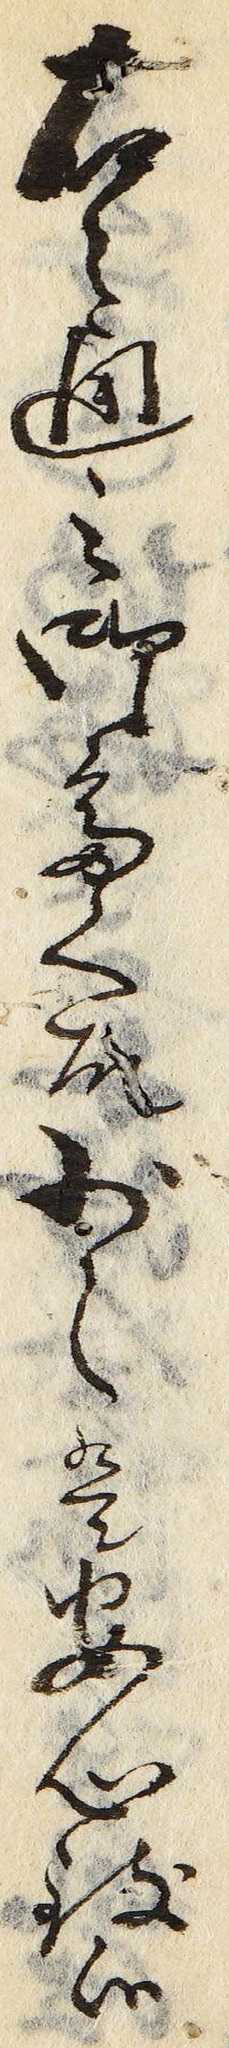右之通之御たく故少しは安心致候
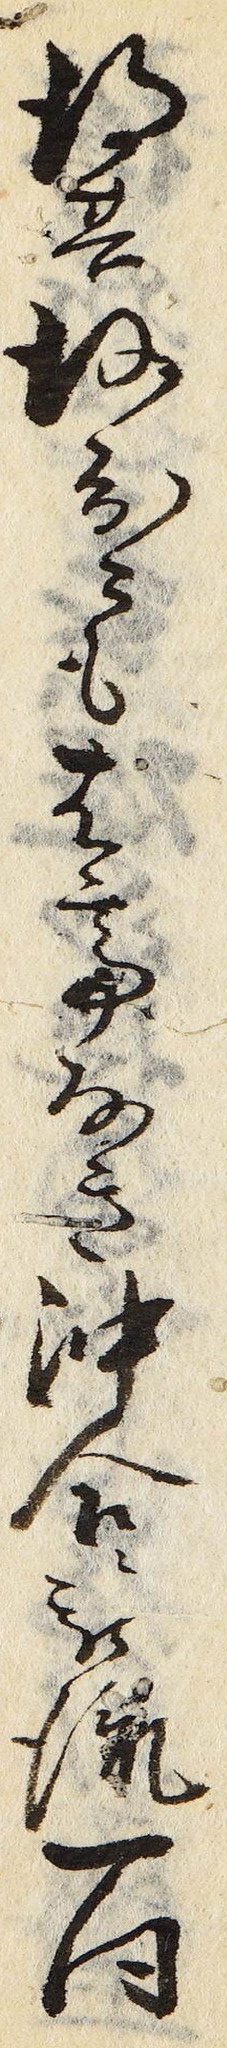得共何分ニもはてなき沖合ニ被流一向
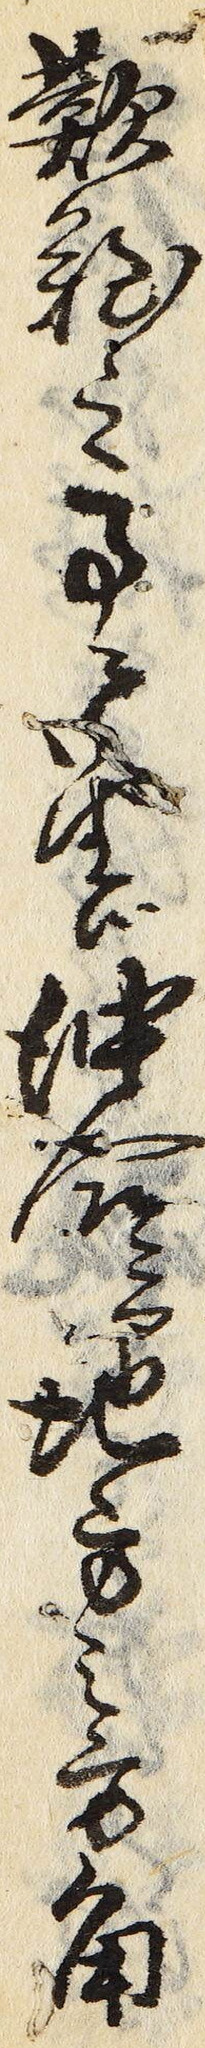歎難之事ニ御座候沖合ニ而地方之方角
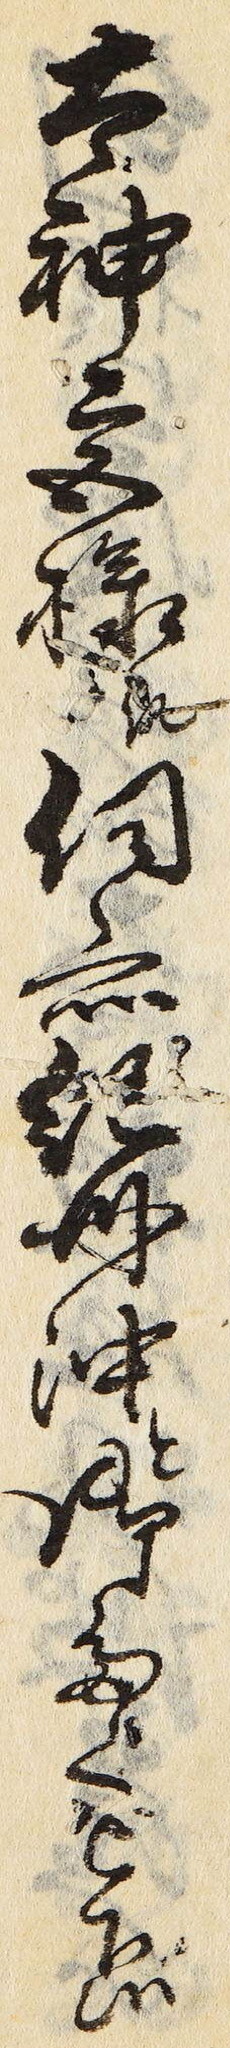太神宮様江伺候所紀州沖と御たく被下候
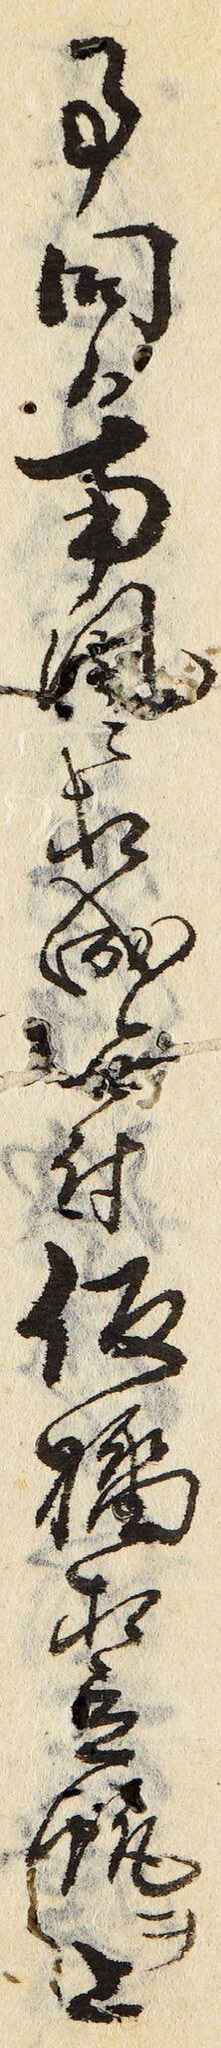事同日南風ニ相成候ニ付仮檣相立帆ヲ上
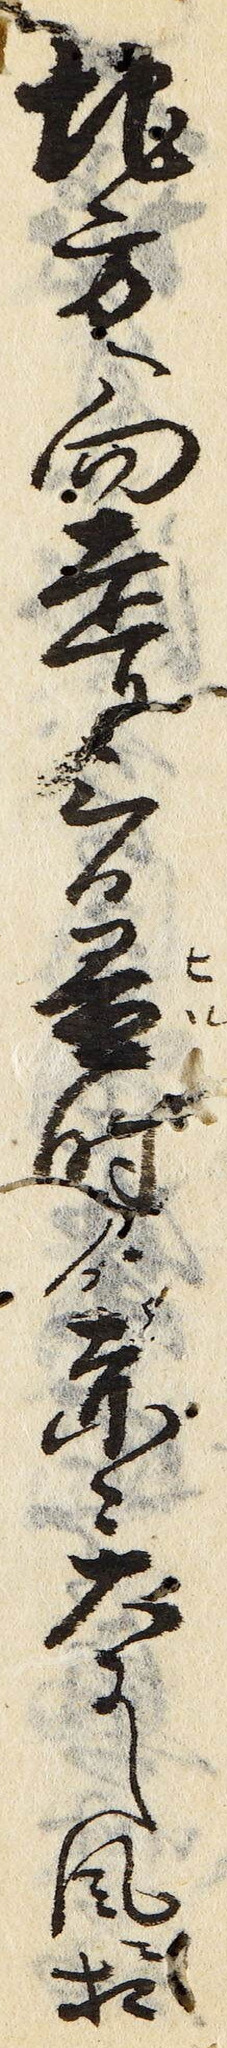地方へ向走り三日昼時ゟ亦々大にし風ニ相
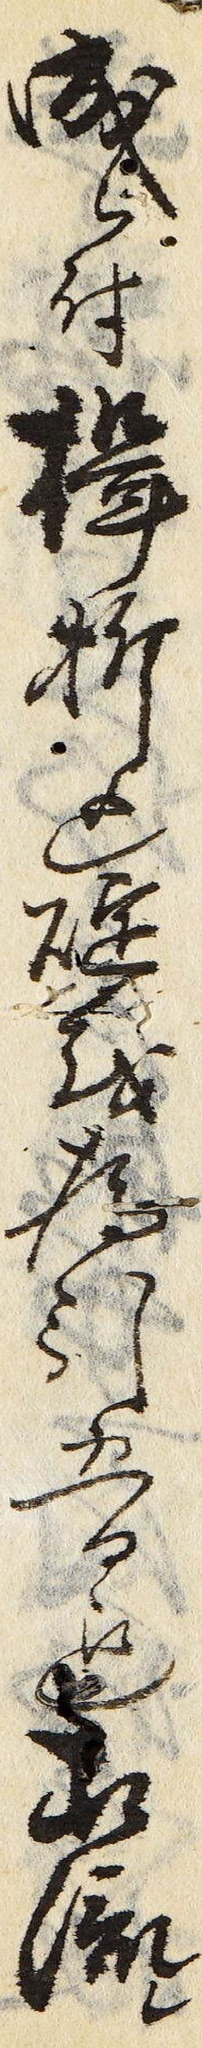成ニ付楫折込碇を為引五日迄相流レ
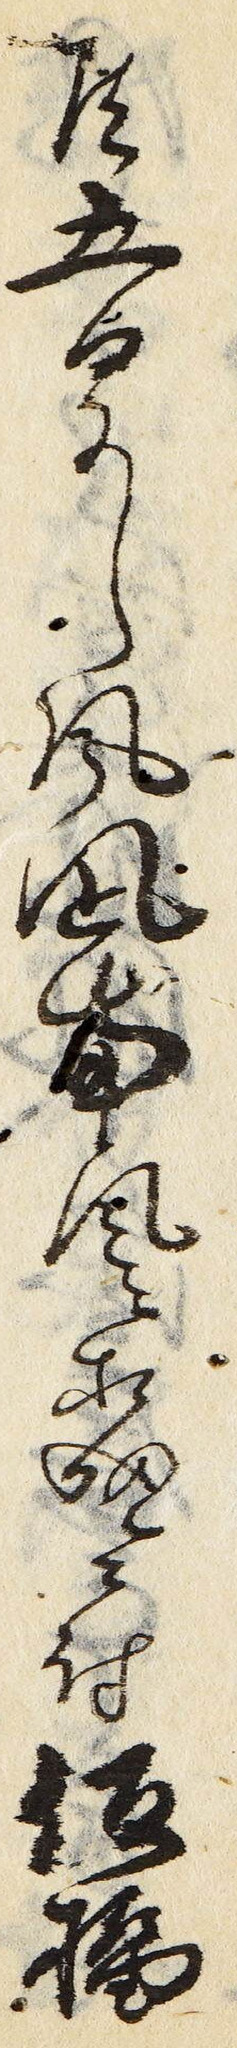候五日にし風凪南風ニ相成候ニ付仮檣
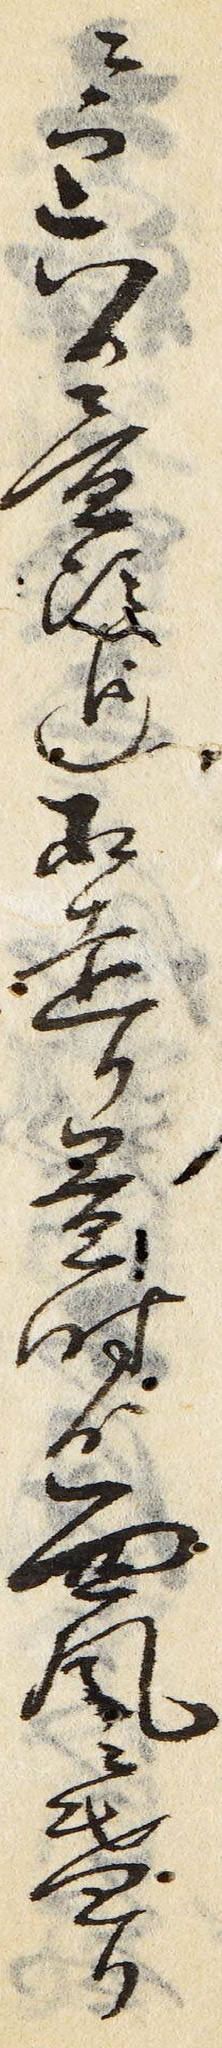ニ而六日昼頃迄相走り昼時ゟ西風ニ替り
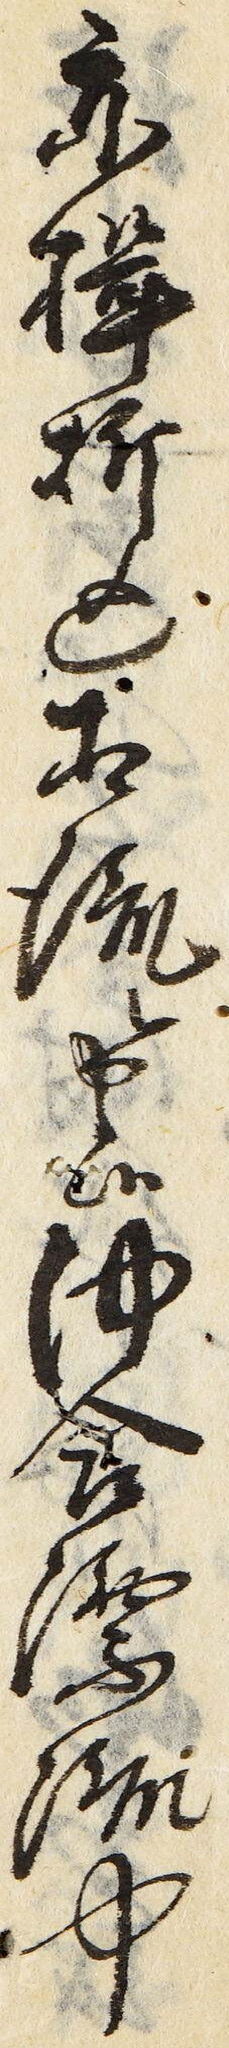亦楫折込相流レ申候沖合漂流中
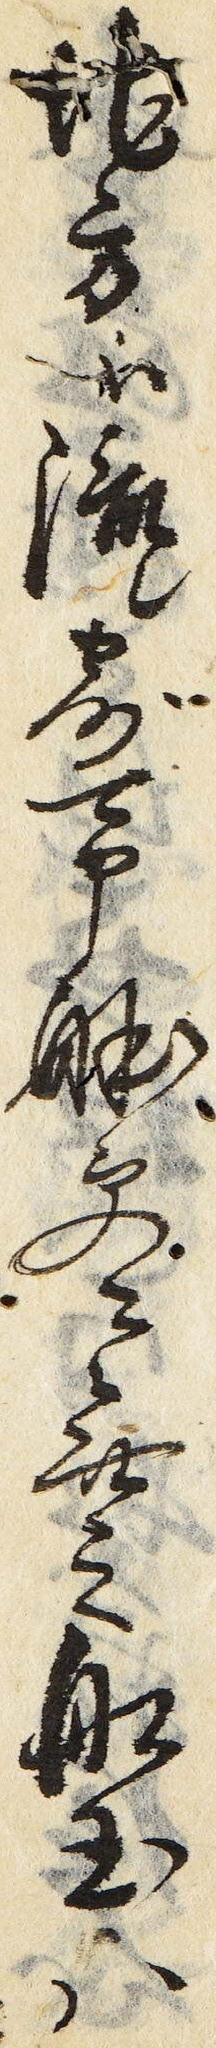地方江流レ寄可申体更ニ無之船玉ハ
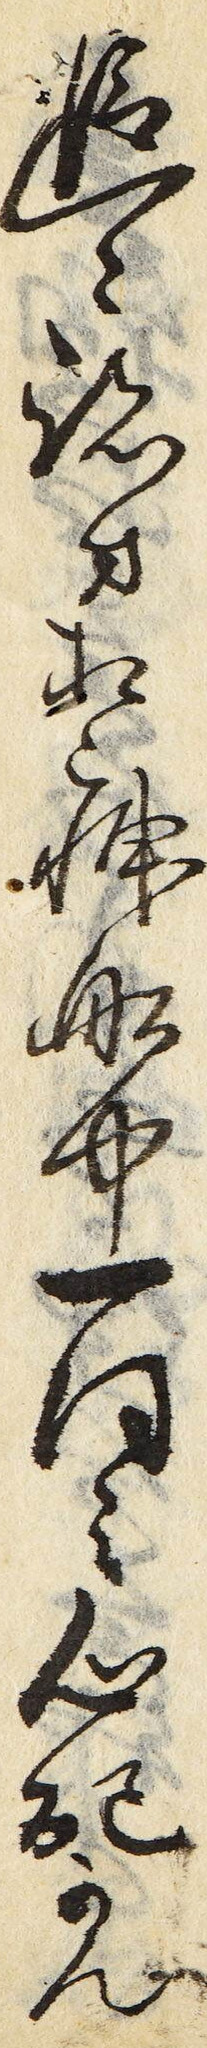追々諸方相痛船中一同之心配かん

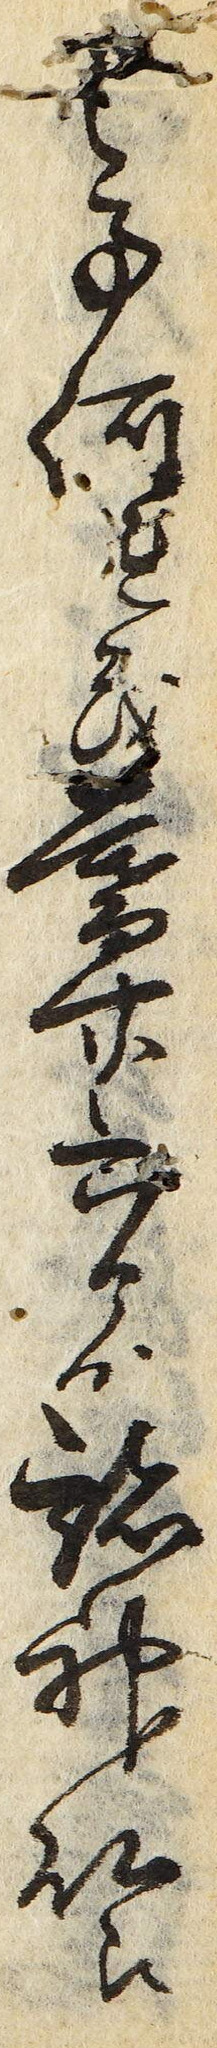事何れも暮廿六日ゟ諸神仏江
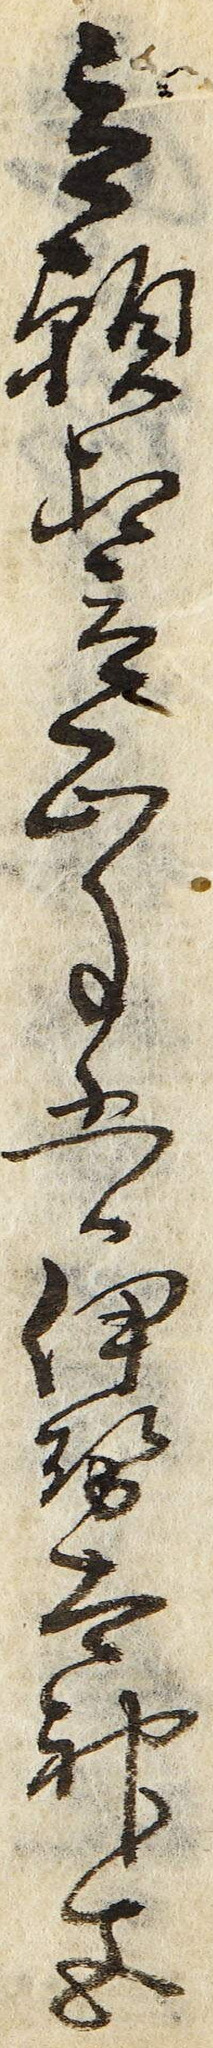立願相立正月五日伊勢太神宮
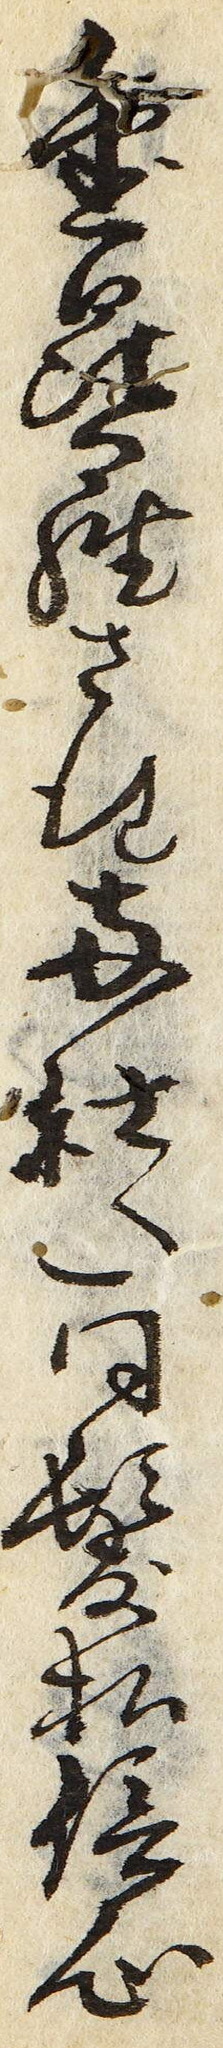金毘羅さ両社へ一同髪払信心
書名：阿波幸宝丸漂流記
